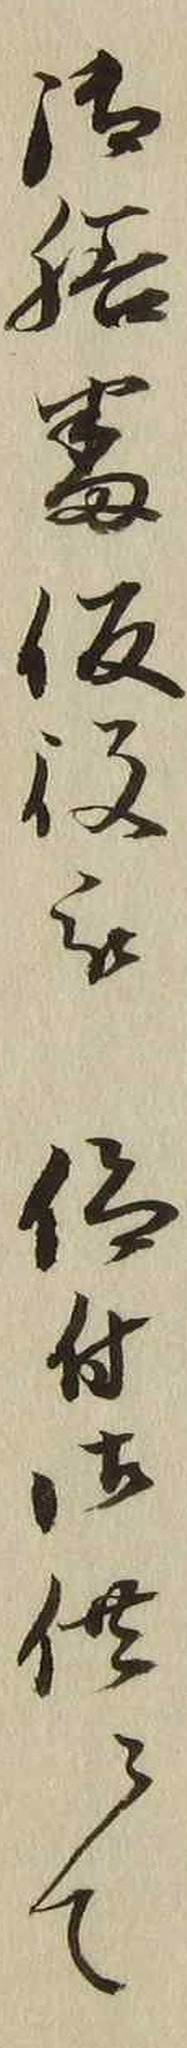御膳番仮役被仰付御供ニて
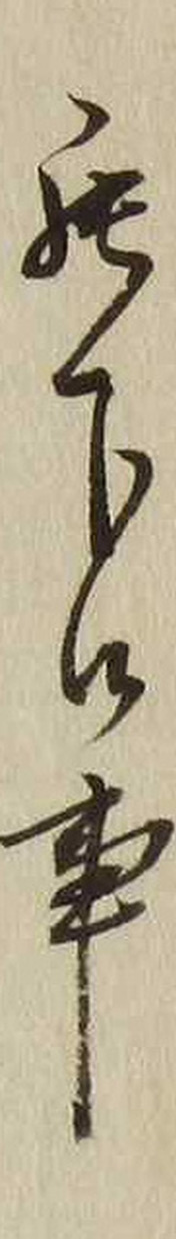罷下候事
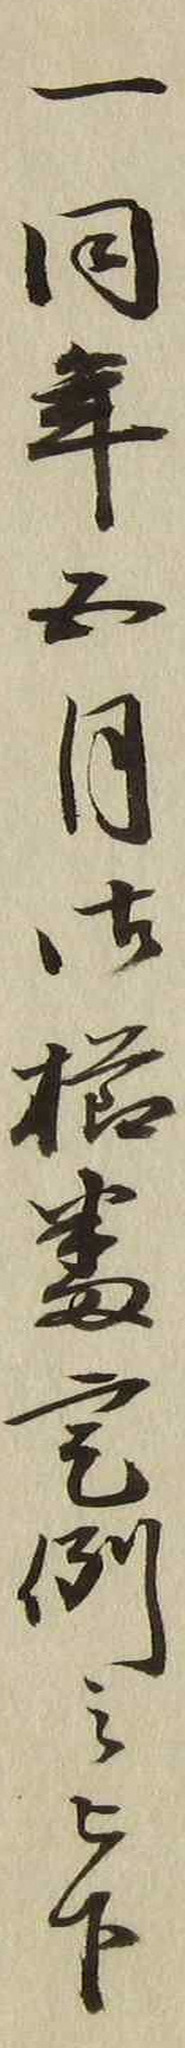一同年五月御櫛番定例之被下
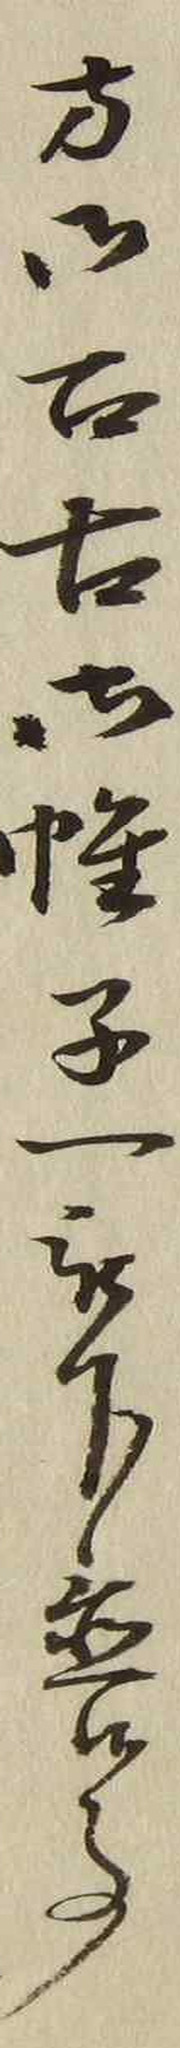方御召古御帷子一被下置候事
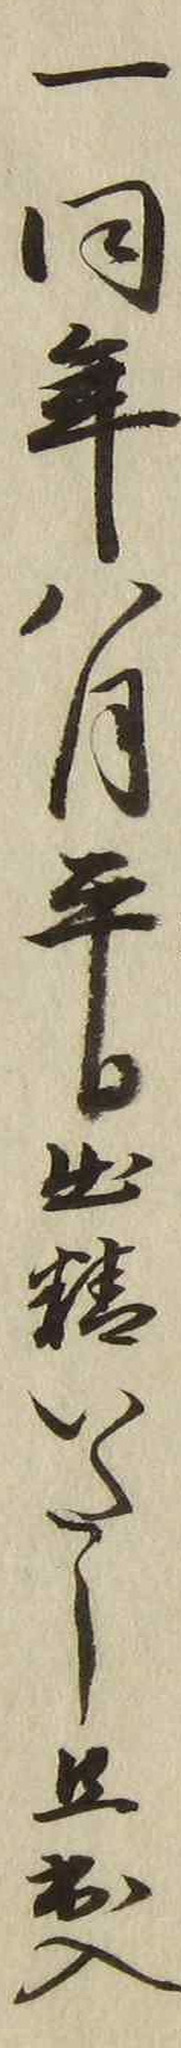一同年八月平日出精いたし且出入
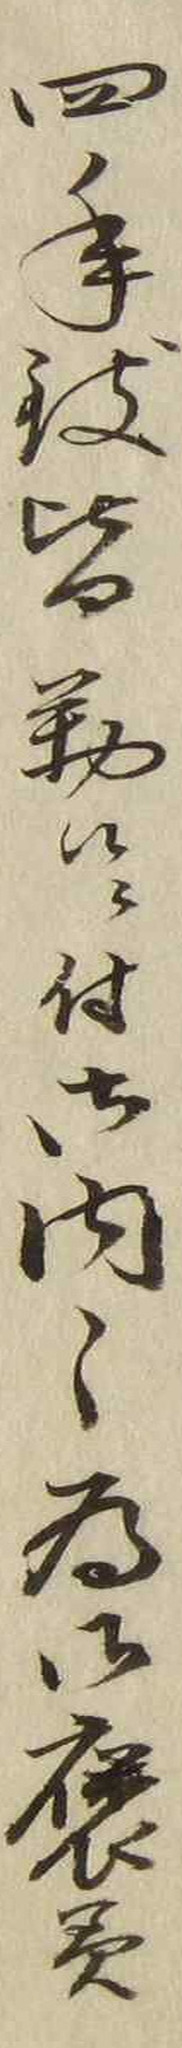四年致皆勤候ニ付御内々為御褒美

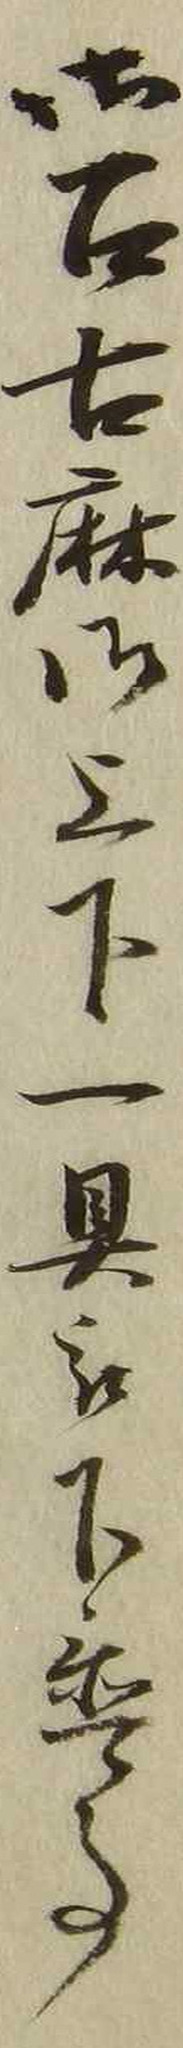御召古麻御上下一具被下置候事
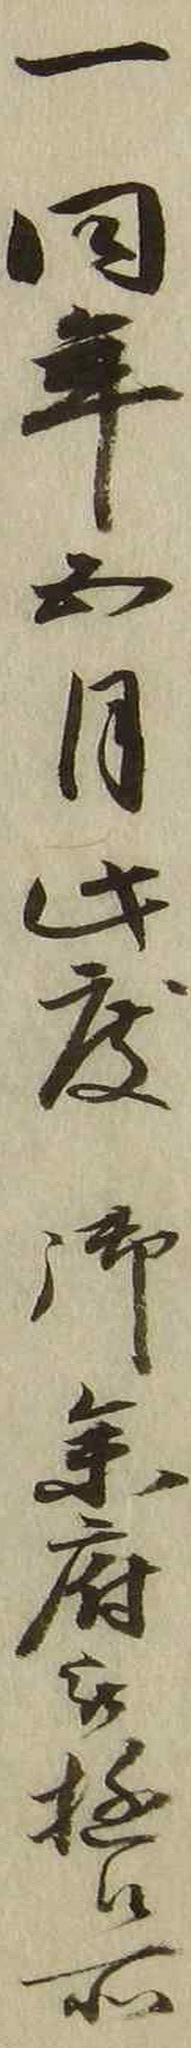一同年五月此度御参府被遊候所
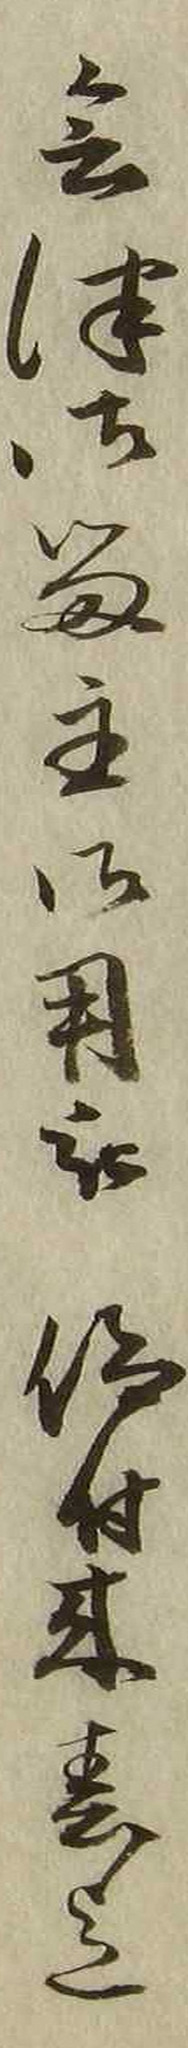会津御留主御用被仰付来春迄
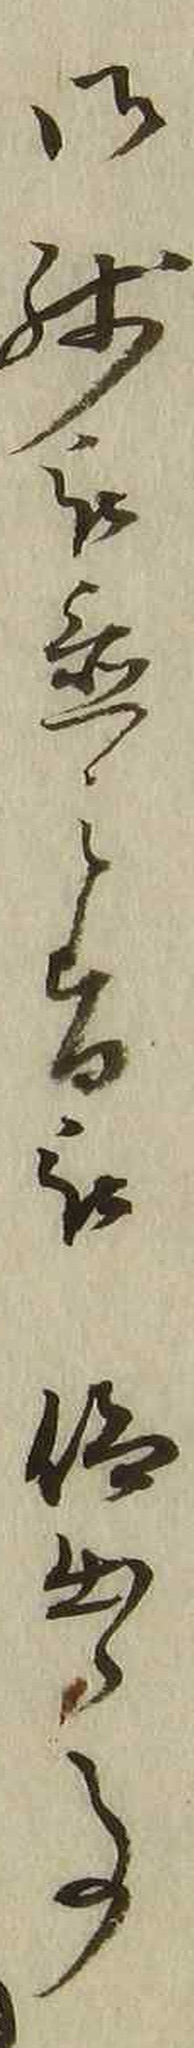御残被置候旨被仰出候事
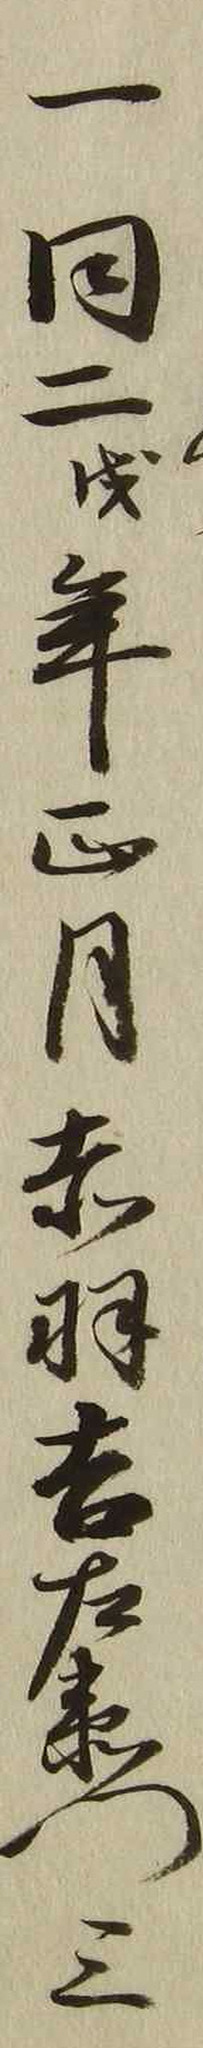一同二戌年正月赤羽吉右衛門三
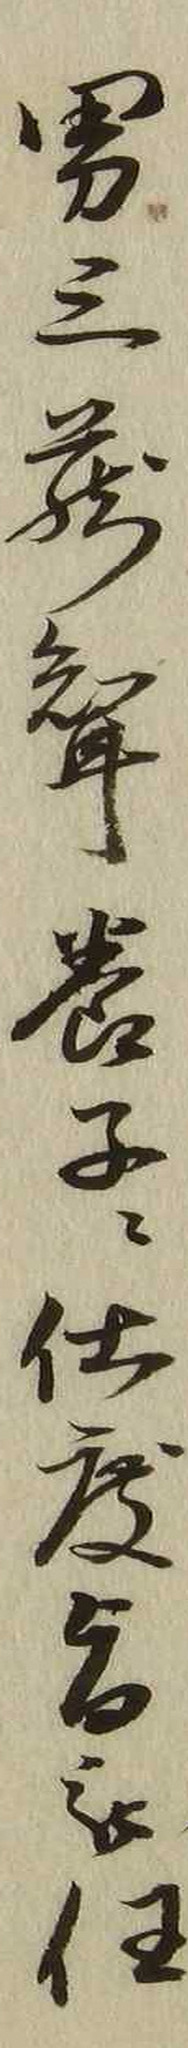男三蔵婿養子ニ仕度旨被任
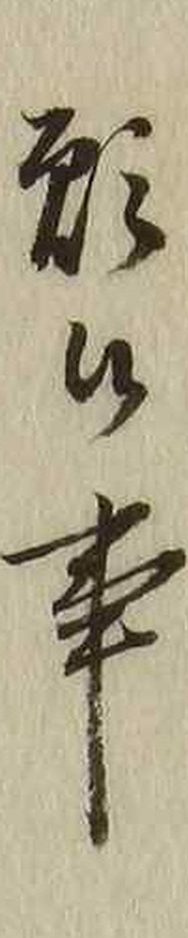願候事
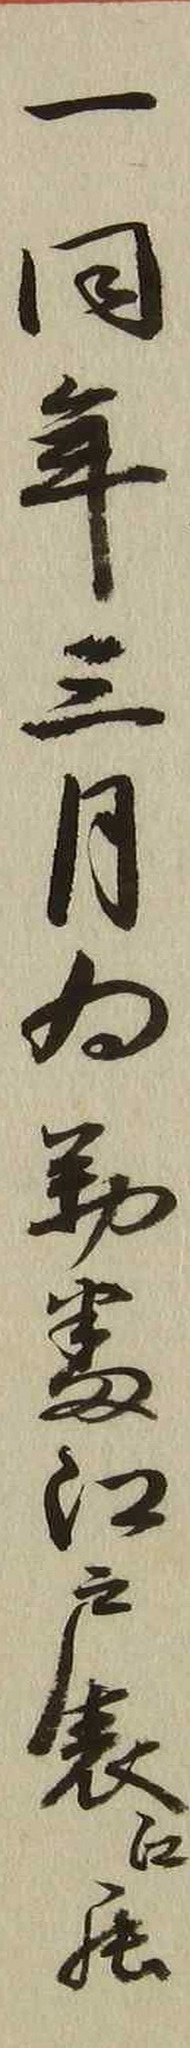一同年三月為勤番江戸表江罷
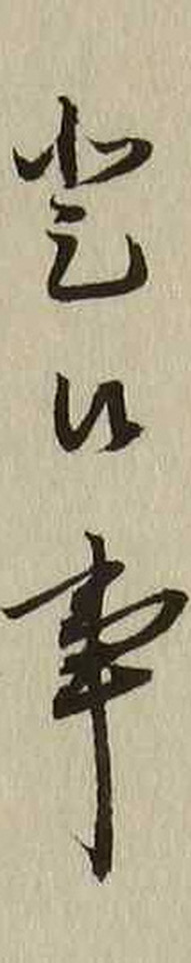登候事
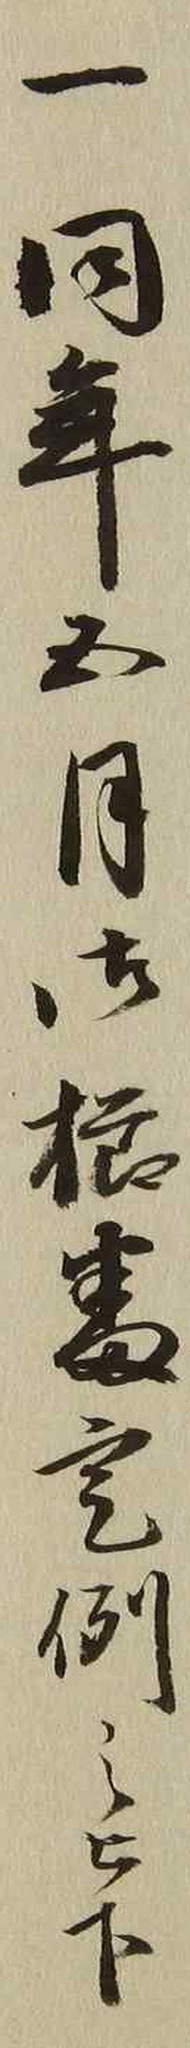一同年五月御櫛番定例之被下
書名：諸士系譜　巻之61　と之部4
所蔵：会津若松市立会津図書館
